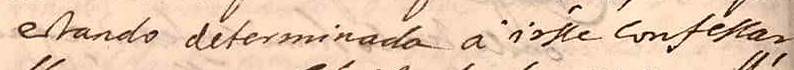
estando determinada a irsse confessar
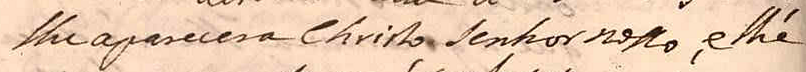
lhe aparecera Christo Senhor nosso, e lhe
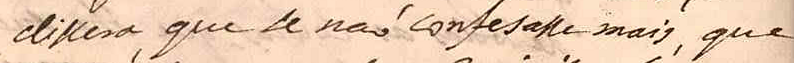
dissera, que se naõ confesasse mais, que
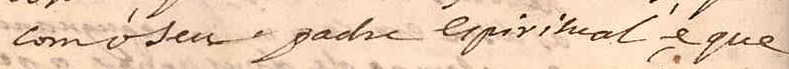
com o seu padre espiritual, e que
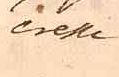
cresse
